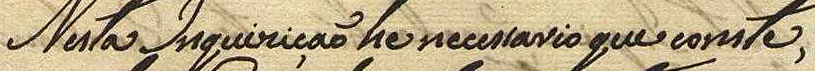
Nesta Inquiziçaõ he necessario que conste,
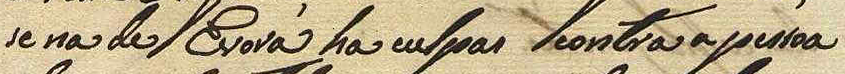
se na de Evora ha culpas contra a pessoa
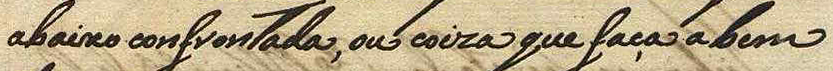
abaixo confrontada, ou coiza que faça a bem
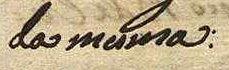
da mesma:
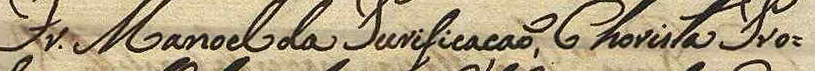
Fr. Manoel da Purificaçaõ, Chorista Pro
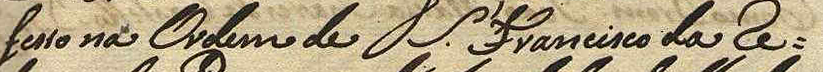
fesso na Ordem de S. Francisco da Re
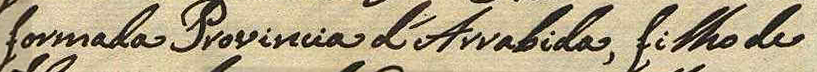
formada Provincia d'Arrabida, filho de
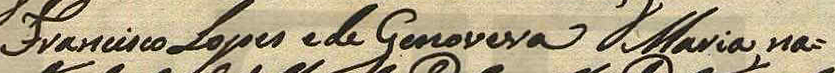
Francisco Lopes e de Genoveva Maria, na
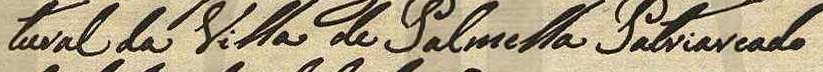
tural da Villa de Palmella Patriarcado
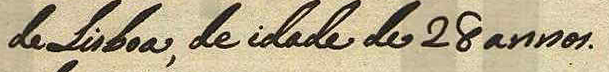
de Lisboa, de idade de 28 annos.
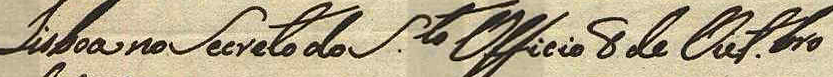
Lisboa no Secreto do S.to Officio 8 de Out.bro
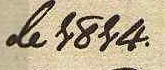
de 1814.
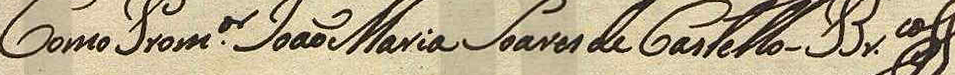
Como Prom.or Ioaõ Maria Soares de Castello Br.co
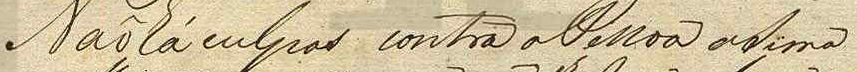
Naõ há culpas contra a Pessoa asima
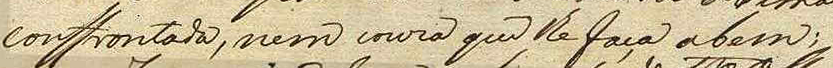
conffrontada, nem couza que lhe faça a bem;
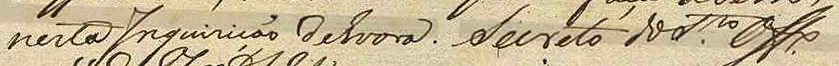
nesta Jnquisiçaõ de Evora. Secreto do S.to Off.o
